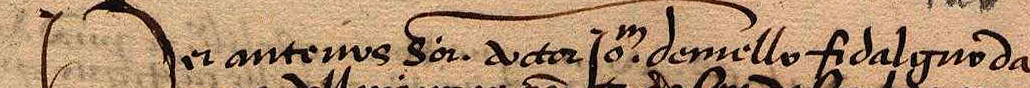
Perante uos Sōr doctor Jom de mello fidalguo da
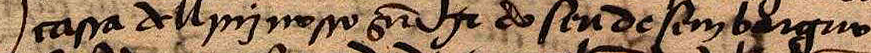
cassa dell rej nosso s̄or e do seu desembarguo
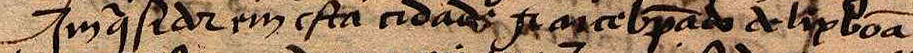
Jmqisidor em esta cidade e arcebpādo de lixboa
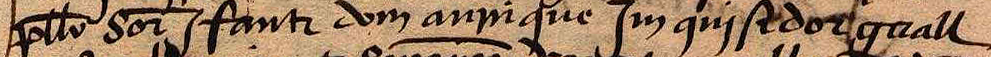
p̄llo Sōr Jfante dom anrrique Jmqujsidor gerall
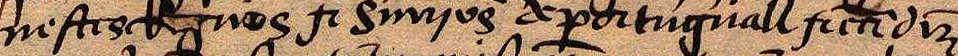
nestes Regnos e Snōrjos de portuguall e c̄et diz
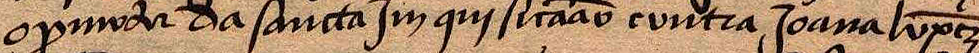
o ꝓmotor da sancta Jmqujsiçãao contra Joana lopez
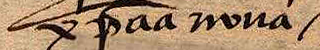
xpāa noua /
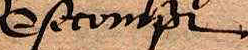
E se compir
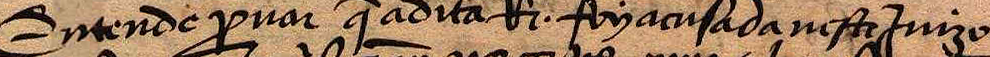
Entende ꝓuar q̄ a dita R. foy acusada neste Juizo
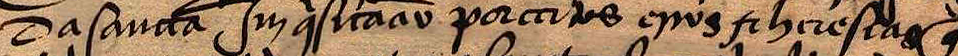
da sancta Jmqisiçaão por certos erros e heresias que
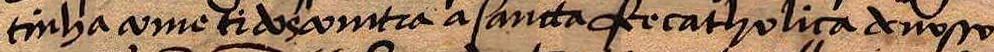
tinha cometidos comtra a sancta fee catholica de nosso
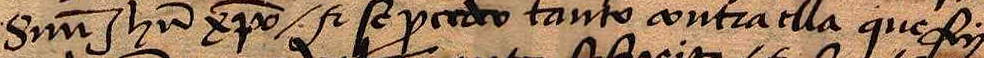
Snōr Jhū xp̄o / e se ꝓcedeo tanto contra ella que foy
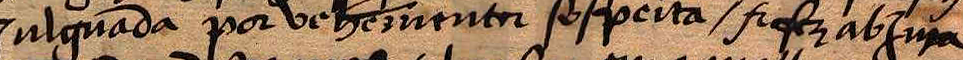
Julguada por vehementer sospeita / e fez abJura
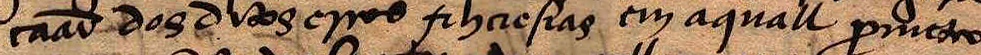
çaão dos ditos erros e heresias em a quall ꝓmeteo
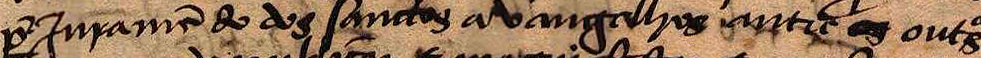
ꝑ Juramēto dos sanctos avangelhos antre as outas
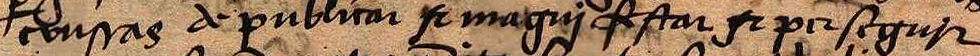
coussas de pubricar e magnjfestar e persegujr
